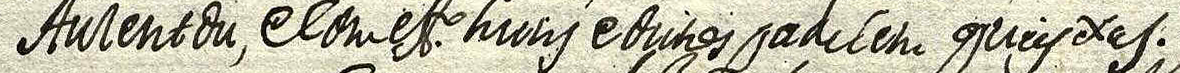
Auzentou, e com eff.o huns e outros padeCem quejxas.
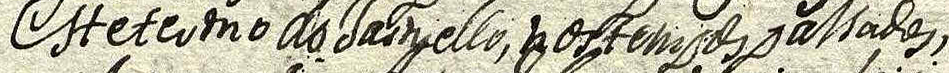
Este termo do Iarmello, nos tempos passados,
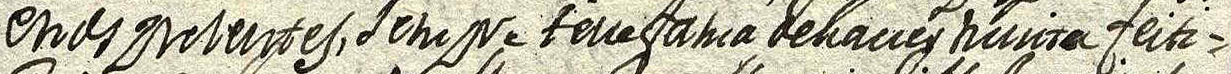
e nos presentes, sempre teue fama de hauer muita feiti
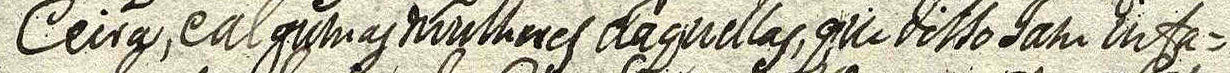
Ceira, e algumas mulheres daquellas, que disso sam infa
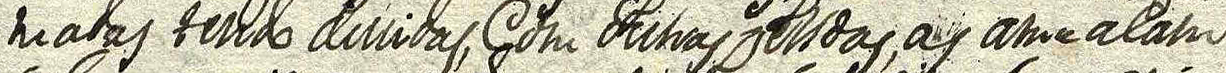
madas tendo diuidas, Com outras pessoas, as ameaCam
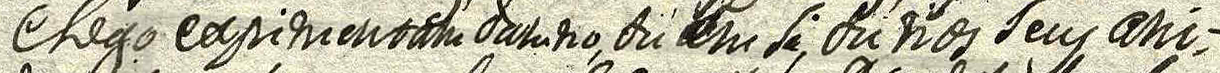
e Logo exprimentam damno, ou em si, ou nos seus ani
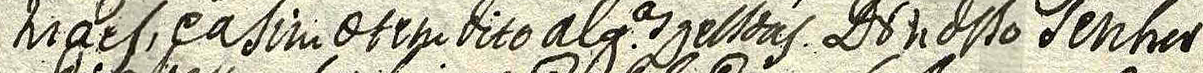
maes, e asim o tem dito alg.as pessoas. Ds nosso Senhor
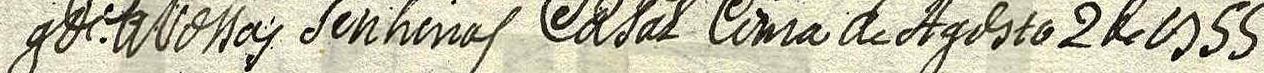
gde. a Vossas Senhorias CasaL Cinza de Agosto 2 de 1755.
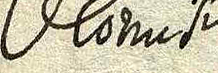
O Comisro
